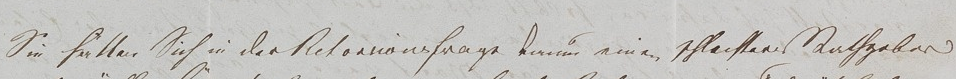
Sie hätten Sich in der Retorsionsfrage kaum einen schlechtern Rathgeber
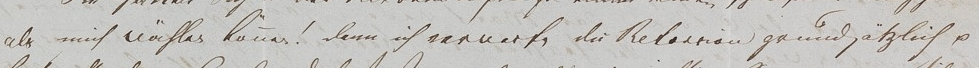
als mich wählen können! Denn ich verwerfe die Retorsion grundsätzlich &
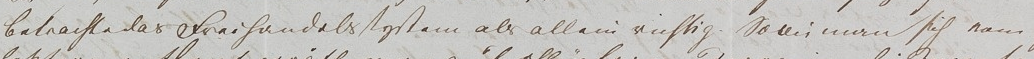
betrachte das Freihandelssystem als allein richtig. So wie man sich vom
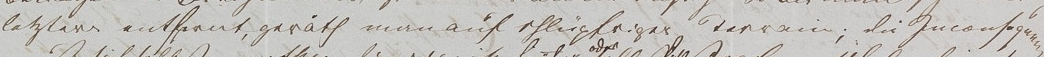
letztern entfernt, geräth man auf schlüpfriges Terrain; die Inconsequenz
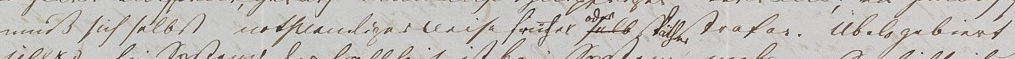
muß sich selbst nothwendigerweise früher selboder späther strafen. Übels gebiert
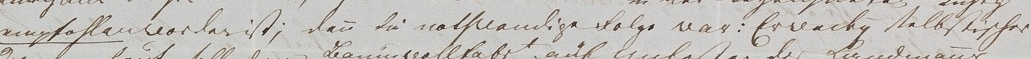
empfohlen worden ist; denn die nothwendige Folge war: Erweckung selbstischer
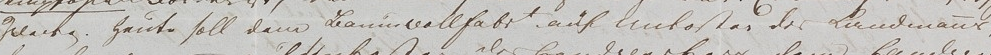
Zwecke. Heute soll dem Baumwollfabrt auf Unkosten des Landmanns,
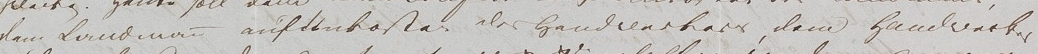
dem Landmann auf Unkosten des Handwerkers, dem Handwerker
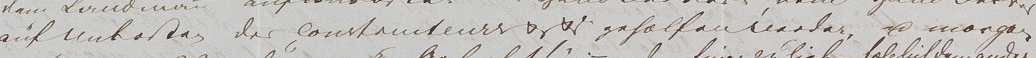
auf Unkosten des Constucteurs u. s. w. geholfen werden, & morgen
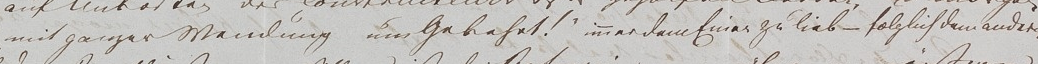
mit ganzer Wendung um Gekehrt! immer dem Einen zu lieb – folglich dem andern
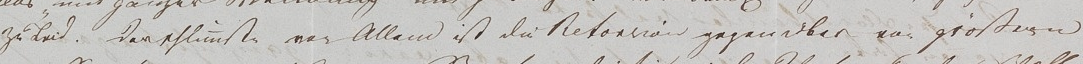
zu Leid. Das schlimmste von Allem ist die Retorsion gegenüber von größern
